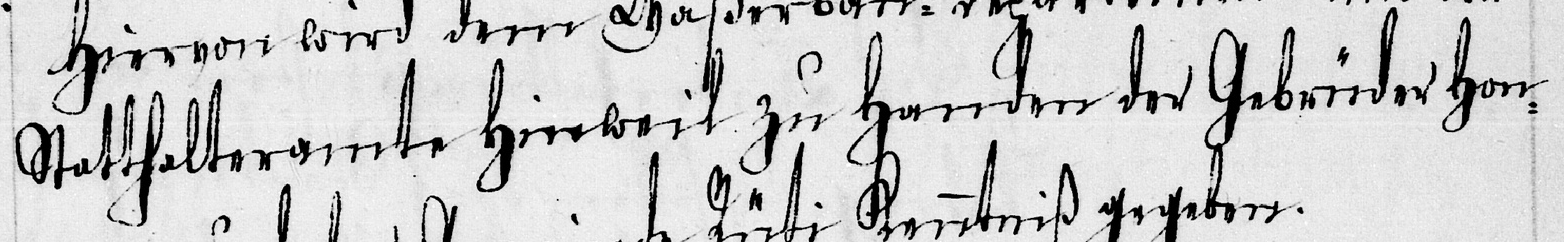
Statthalteramte Hinweil zu Handen der Gebrüder Hon¬
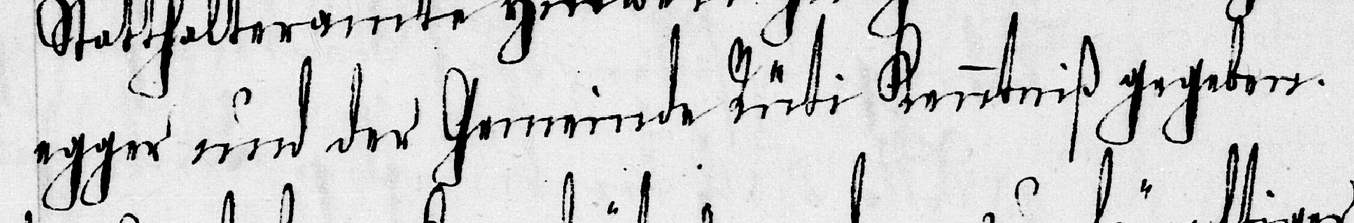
egger und der Gemeinde Rüti Kenntniß gegeben.
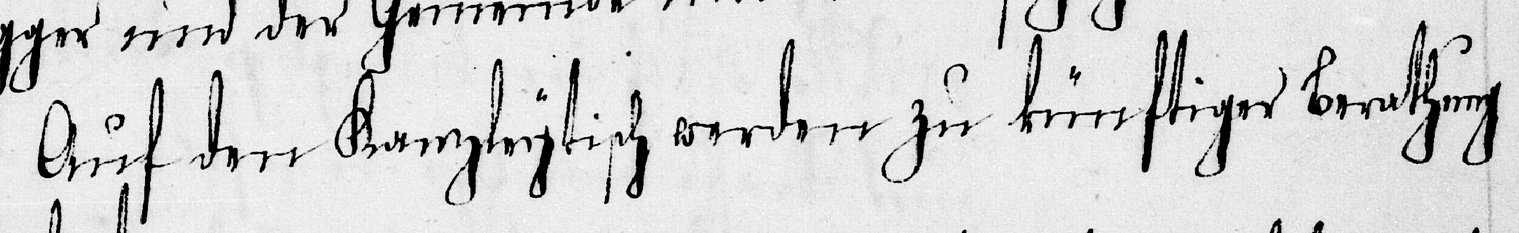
Auf den Kanzleytisch werden zu künftiger Berathung
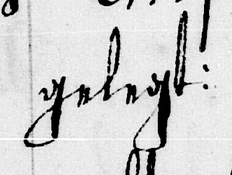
gelegt:
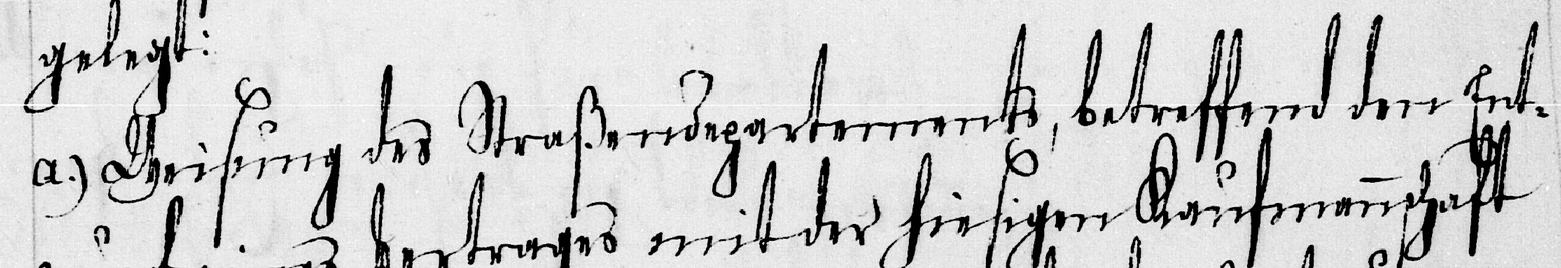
a.) Weisung des Straßendepartements, betreffend den Ent¬
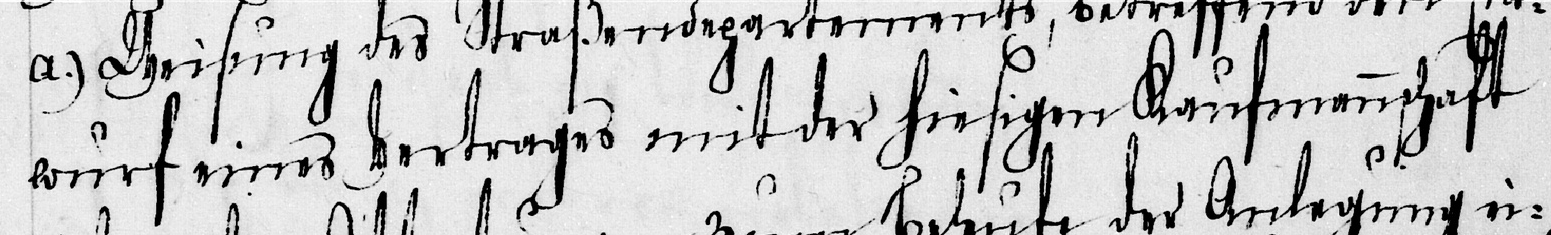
wurf eines Vertrages mit der hiesigen Kaufmannschaft
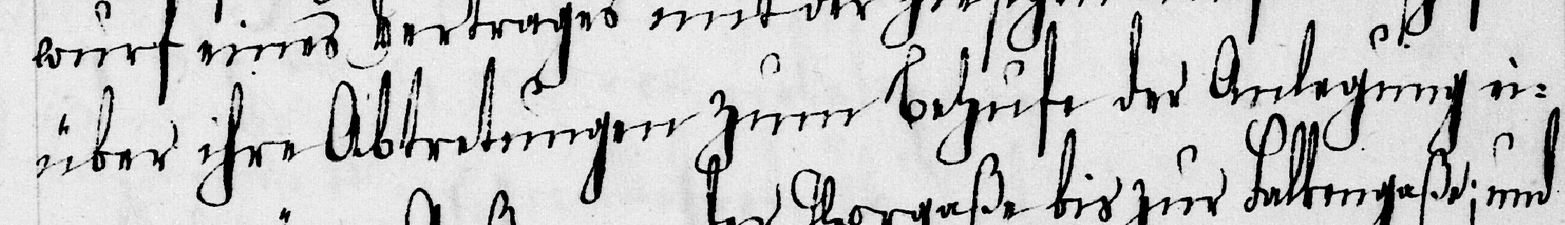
über ihre Abtretungen zum Behufe der Anlegung ei¬
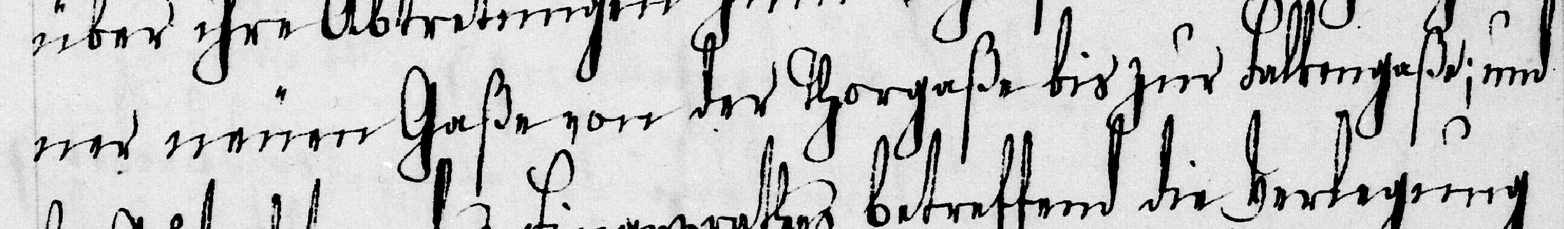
ner neuen Gaße von der Thorgaße bis zur Falkengaße; und
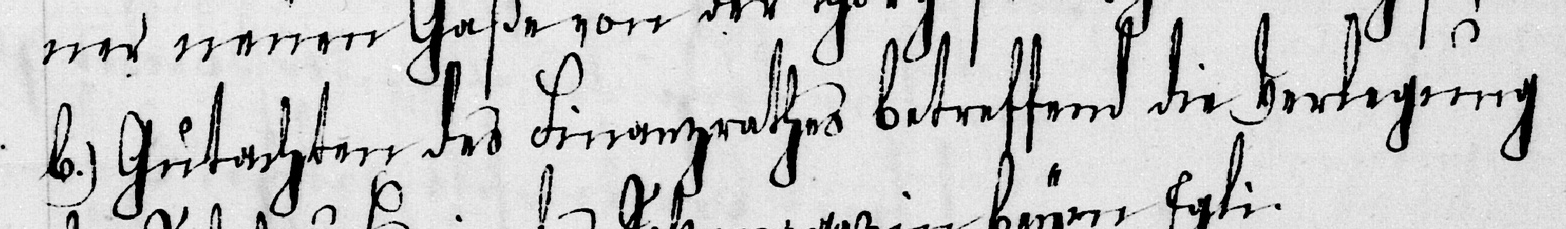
b.) Gutachten des Finanzrathes betreffend die Verlegung
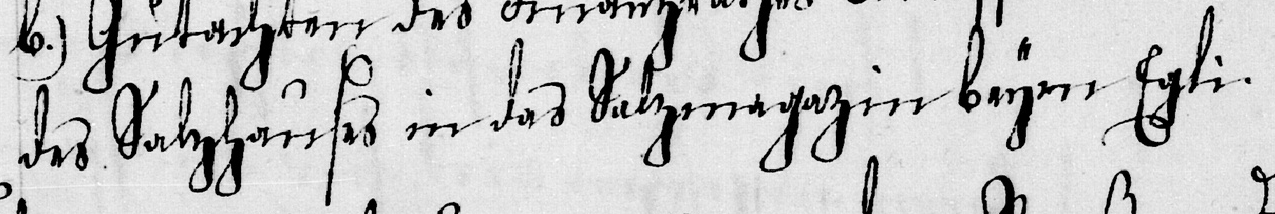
des Salzhauses in das Salzmagazin beym Egli.
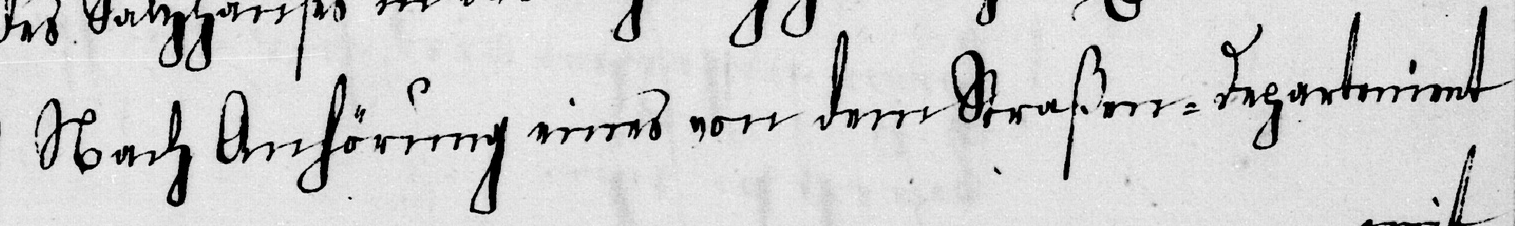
Nach Anhörung eines von dem Straßen-Departement
